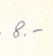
-8.-
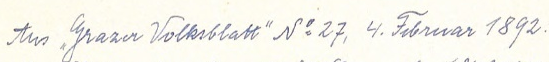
Aus "Grazer Volksblatt" Nr. 27, 4. Gebruar 1892:
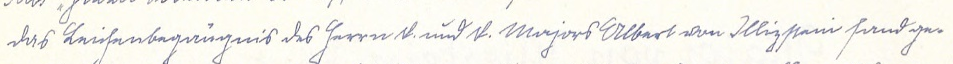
Das Leichenbegräpnis des Herrn k. und k. Majors Albert von Illizstein fand ge-
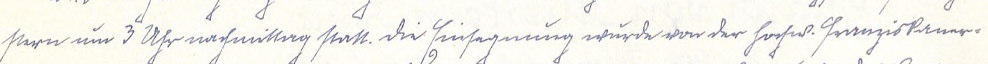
stern um 3 Uhr nachmittag statt. Die Einsegnung wurde von der hochw. Franziskaner-
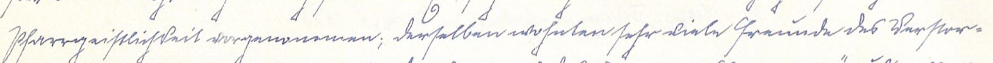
Pfarrgeistlichkeit vorgenommen; derselben wohnten sehr viele Freunde des Verstor-
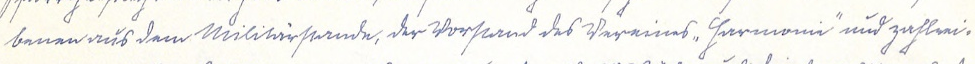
benen aus dem Militärstande, der Vorstand des Vereines "Harmonie" und zahlrei-
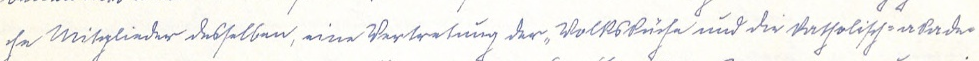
che Mitglieder desselben, wie Vertretung der "Volksbühne" und die katholisch-akade-
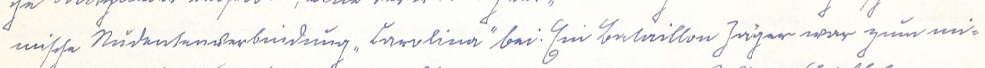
mische Studentenverbindung "Carolina" bei: Ein Bataillon Jäger war zum mi-
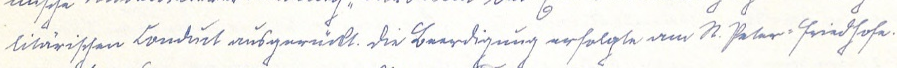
litärischen Conduct ausgerückt. Die Beerdigung erfolgte am St. Peter-Friedhofe. -
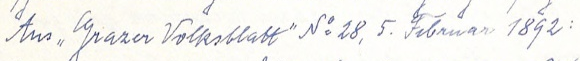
Aus "Grazer Volksblatt" Nr. 28, 5. Februar 1892:
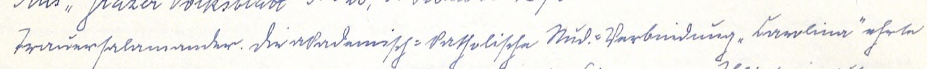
Trauersalamander der akademisch-katholischee Stud.-Verbindung "Carolina" ehrte
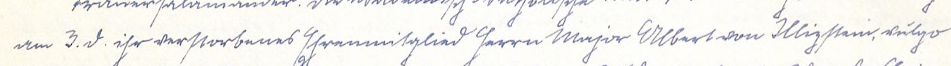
am 3. d. ihr verstorbenes Ehrenmitglied Herrn Major Albert von Illizstein, vulog
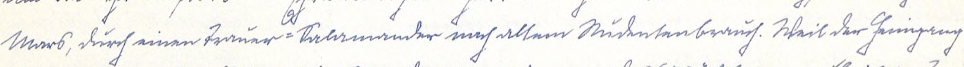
Mars, durch einen Trauer-Salamander nach altem Studentenbrauch. Weil der Heimgang
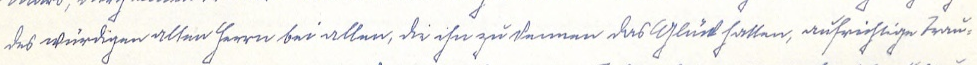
des würdigen alten Herrn bei allen, die ihn zu kennen das Glück hatten, aufrichtige Trau-
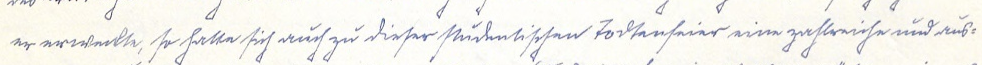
er erweckte, so hatte sich auch zu dieser studentischen Totenfeier eine zahlreiche und aus-
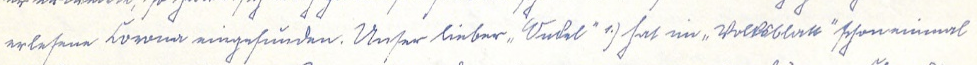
erlesene xxx eingefunden. Unser lieber "xxx"1.) hat im "Volksblatt" schon einmal
